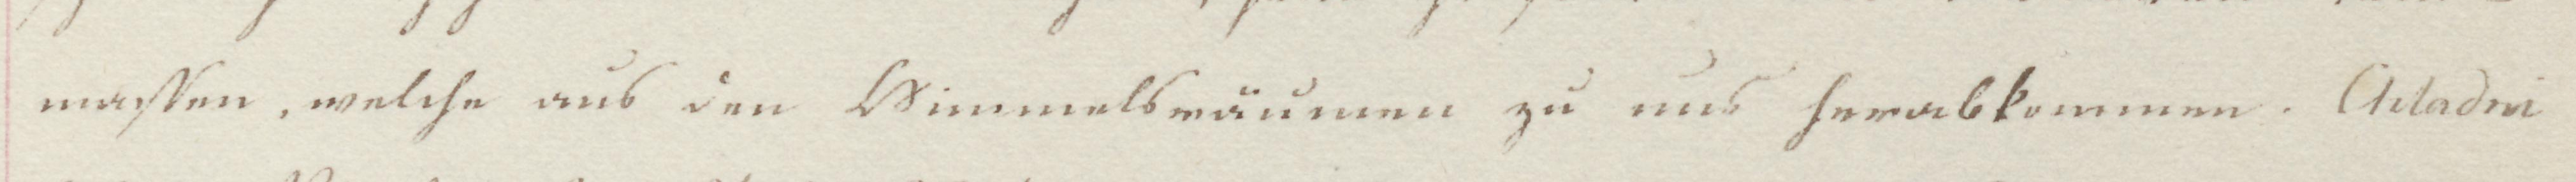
massen, welche aus den Himmelsräumen zu uns herabkommen. Chladni
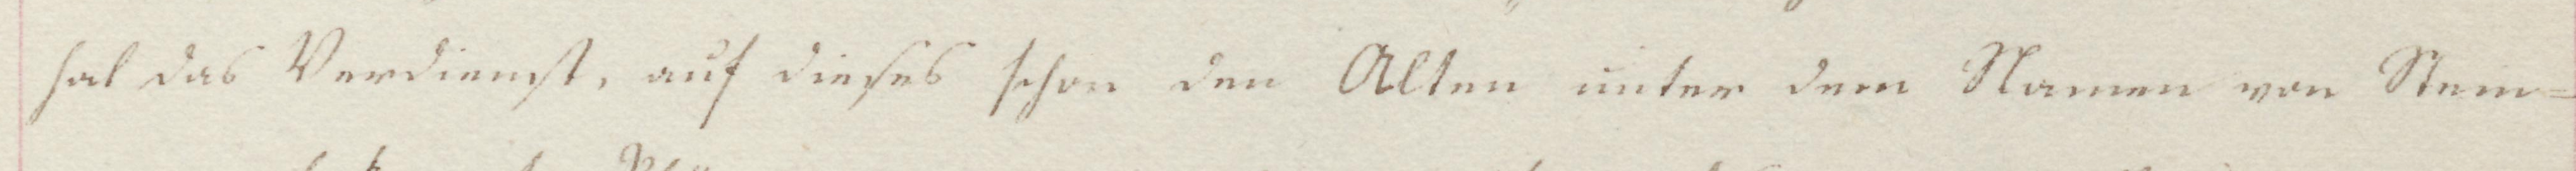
hat das Verdienst, auf dieses schon den Alten unter dem Namen von Stein-
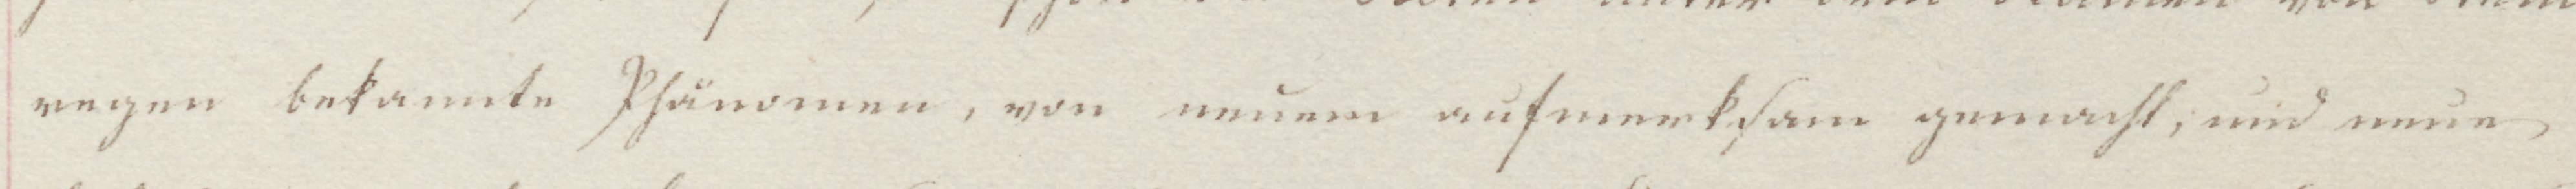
regen bekannte Phänomen, von neuem aufmerksam gemacht, und neue
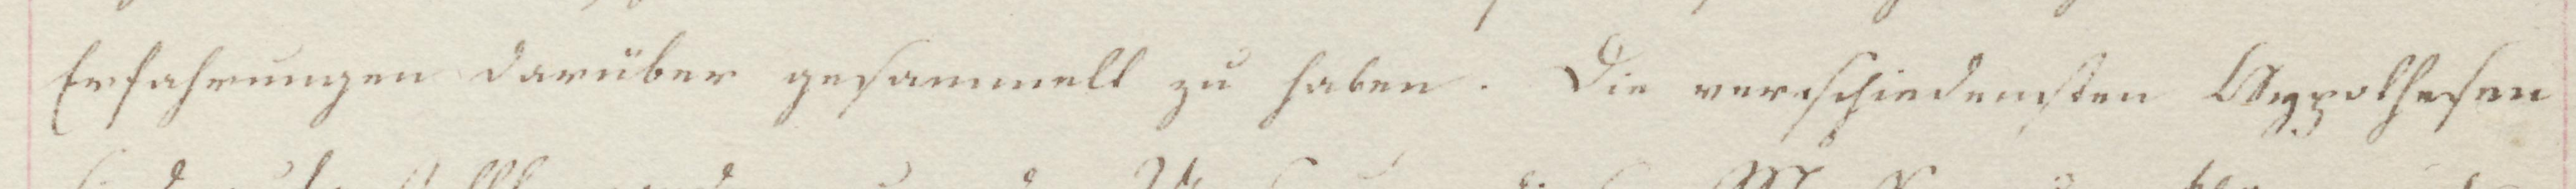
Erfahrungen darüber gesammelt zu haben. Die verschiedensten Hypothesen
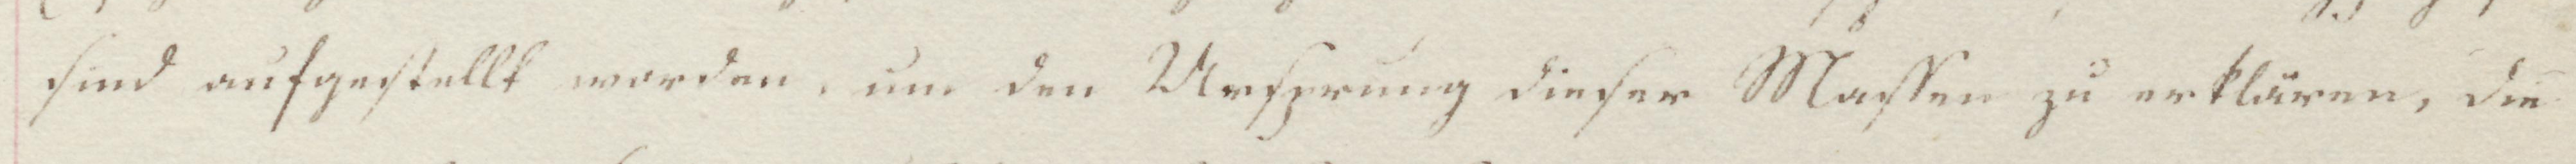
sind aufgestellt worden, um den Ursprung dieser Massen zu erklären, die
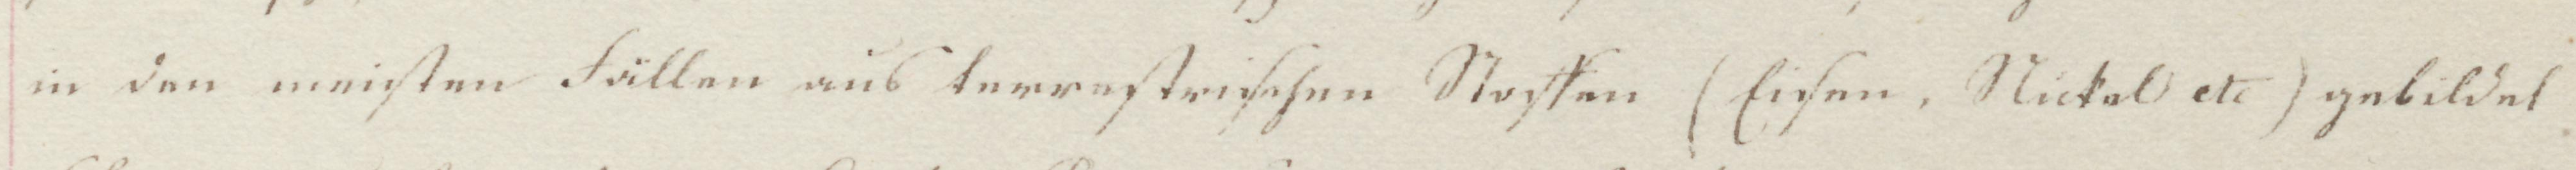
in den meisten Fällen aus terrestrischen Stoffen gebildet
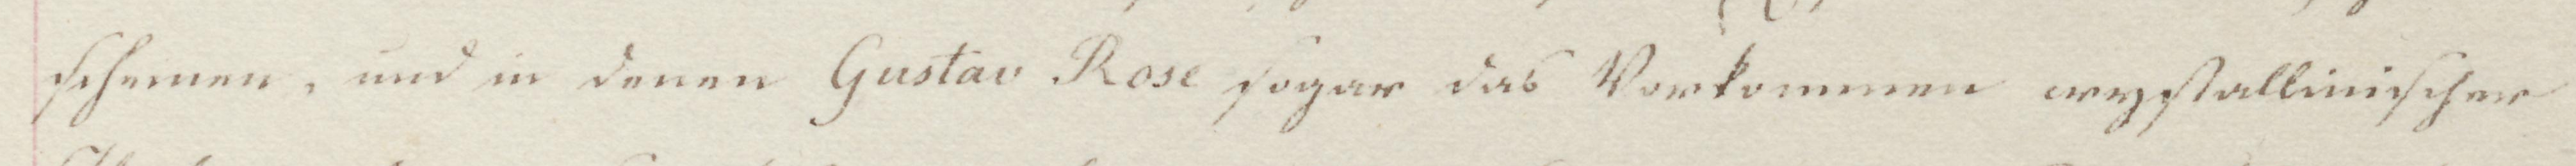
scheinen, und in denen Gustav Rose sogar das Vorkommen crystallinischer
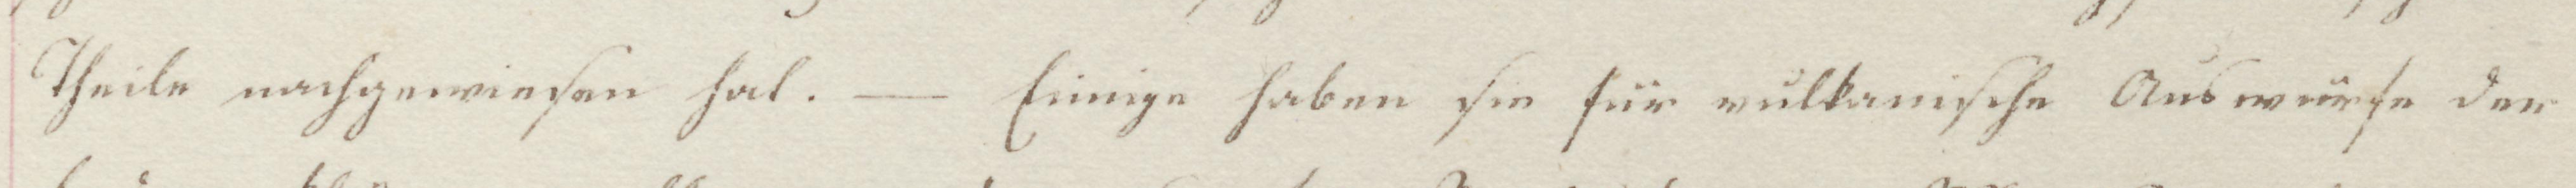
Theile nachgewiesen hat. – Einige haben sie für vulkanische Auswürfe der
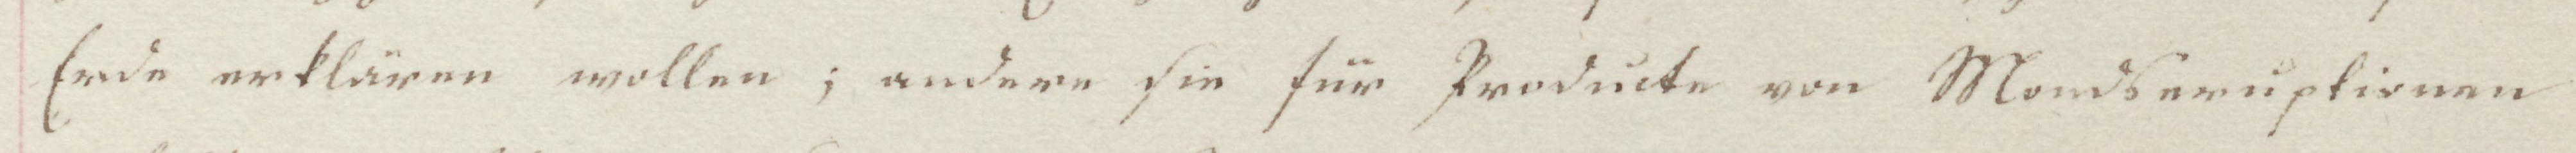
Erde erklären wollen; andere sie für Producte von Mondseruptionen
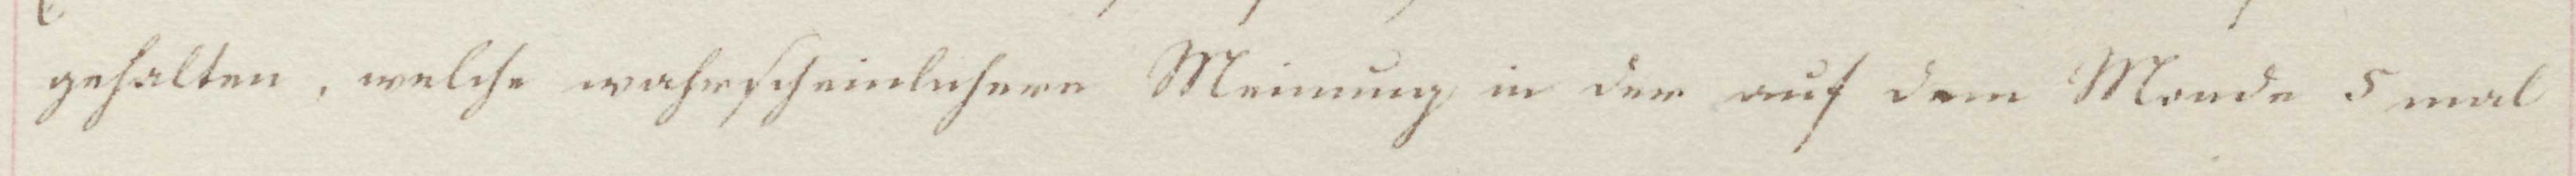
gehalten, welche wahrscheinlichere Meinung in der auf dem Monde 5 mal
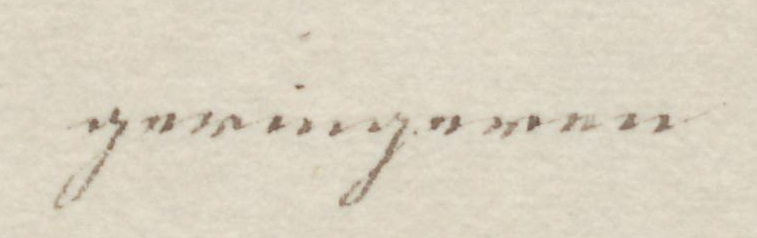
geringeren
